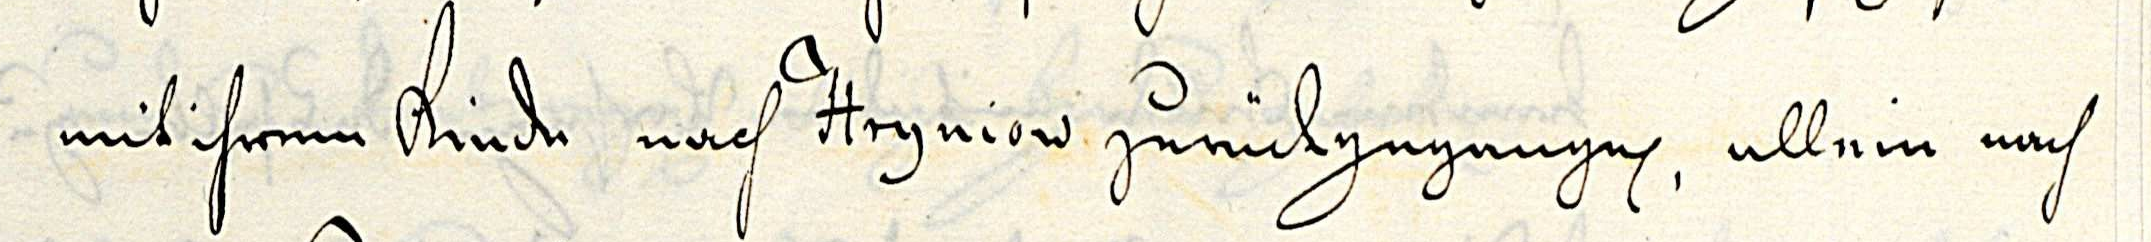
mit ihrem Kinde nach Hryniow zurückgegangen, allein nach
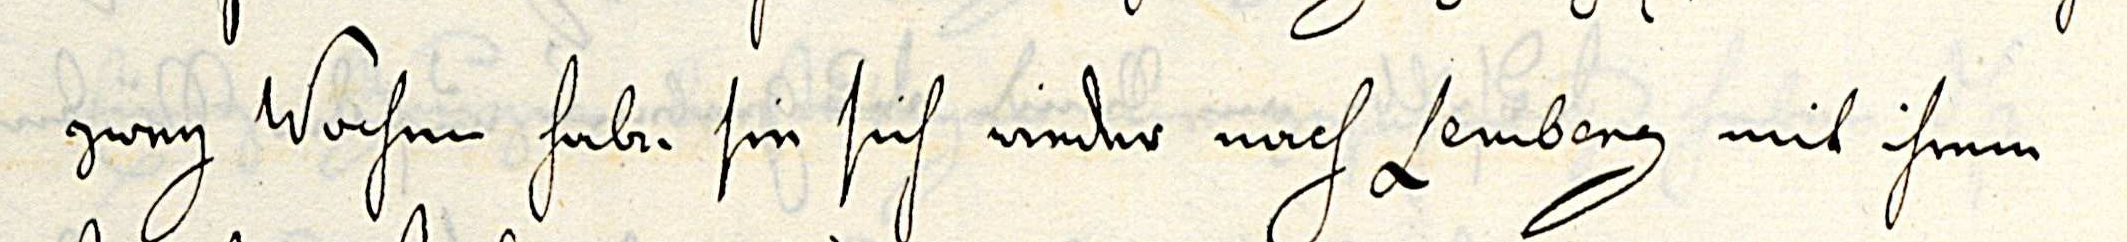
zwey Wochen habe sie sich wieder nach Lemberg mit ihrem
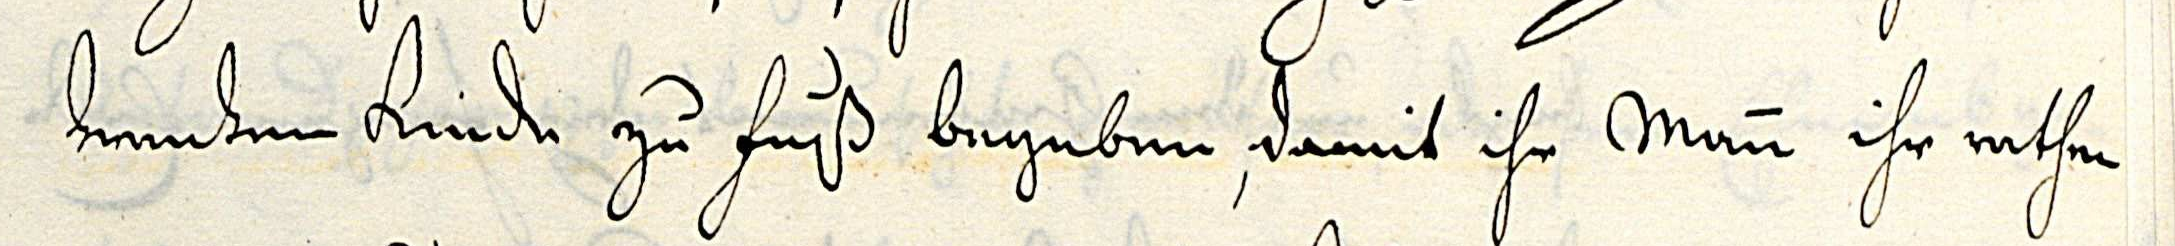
kranken Kinde zu Fuß begeben, damit ihr Mann ihr rathen
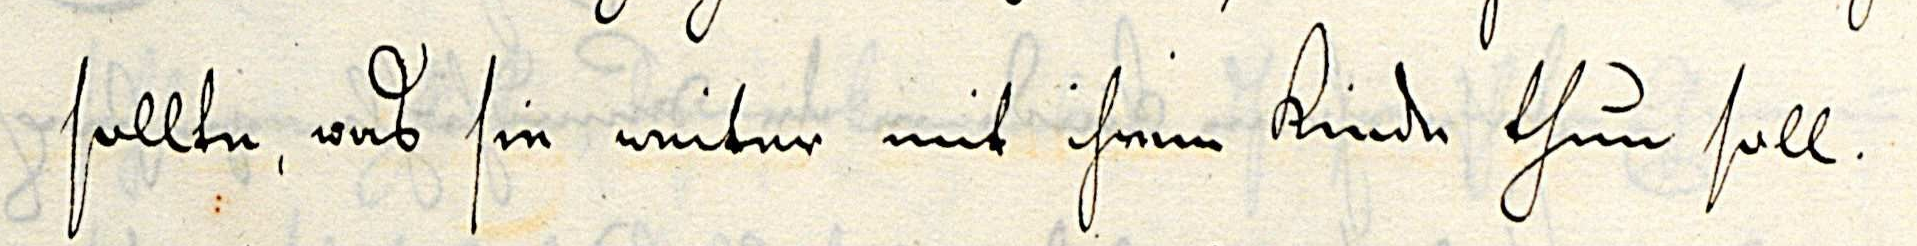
sollte, was sie weiter mit ihrem Kinde thun soll.
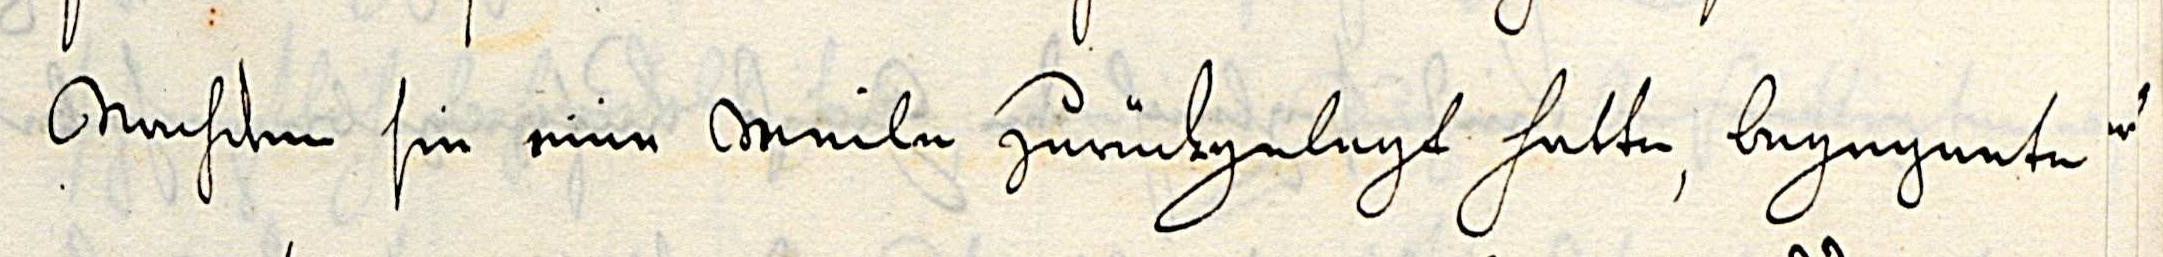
Nachdem sie eine Meile zurückgelegt hatte, begegnete
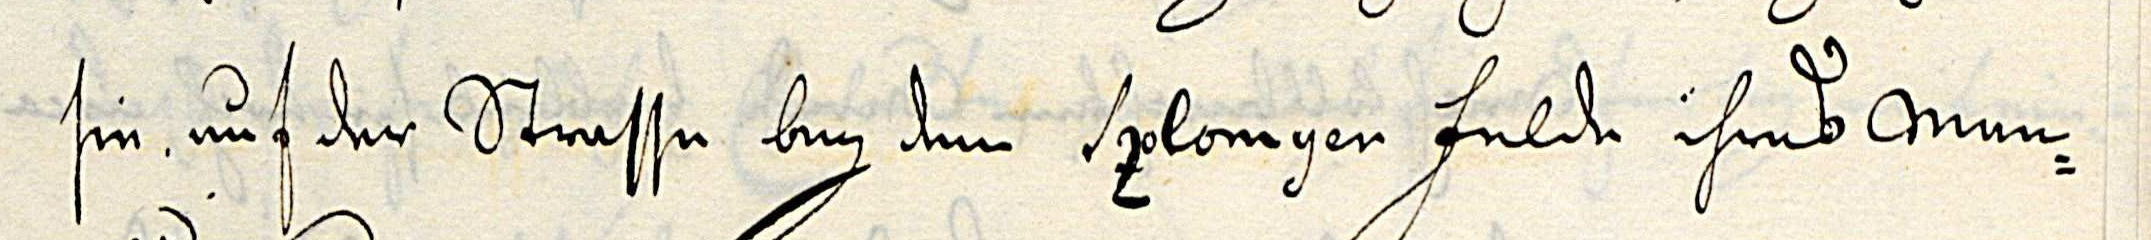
sie auf der Strasse bey dem Szolmyer Felde ihres Man¬
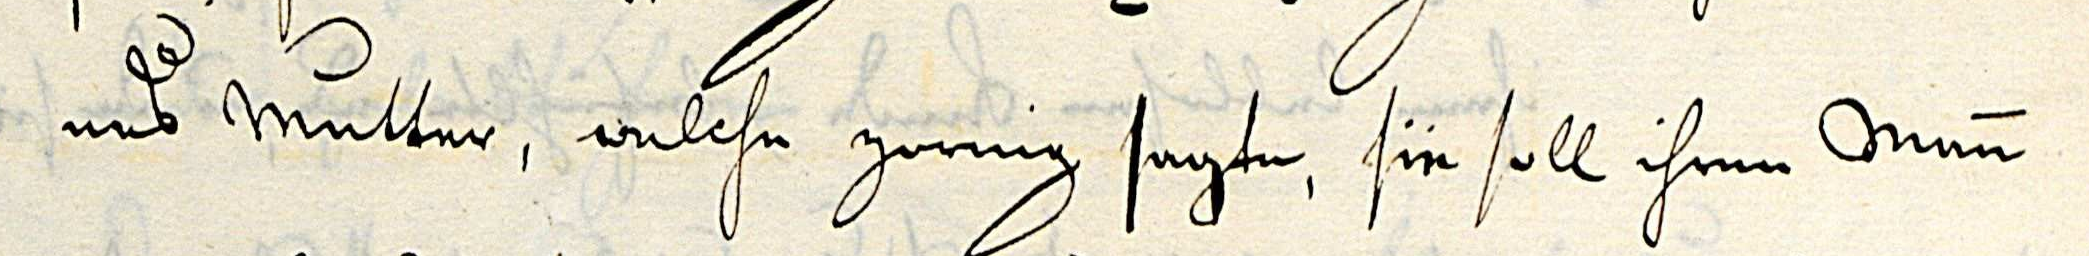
nes Mutter, welche zornig sagte, sie soll ihren Mann
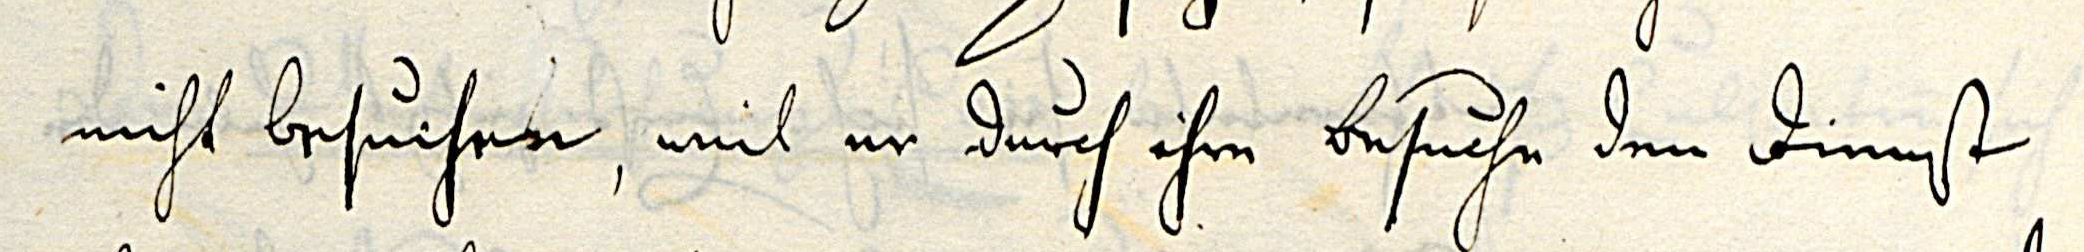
nicht besuchen, weil er durch ihre Besuch den Dienst
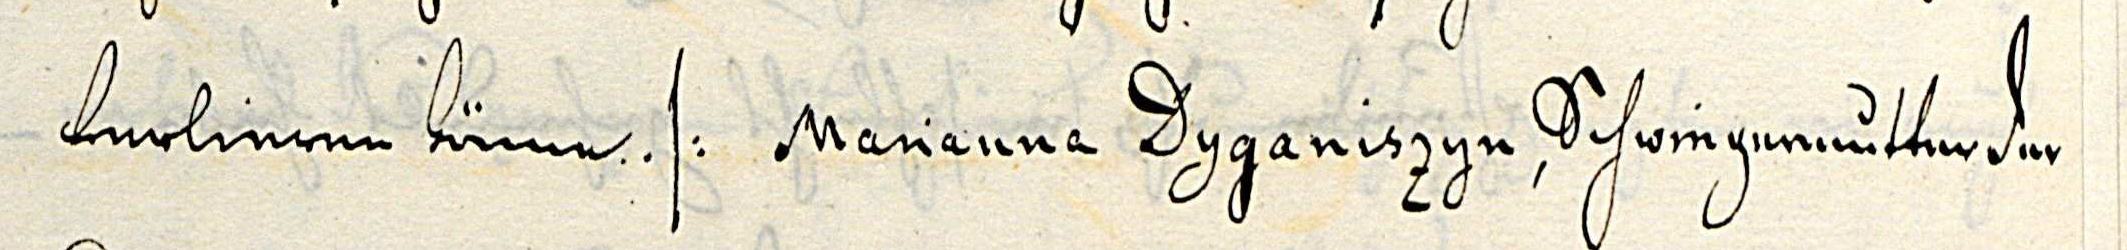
verlieren könne. (Marianna Dyganiszyn, Schwiegermutter der
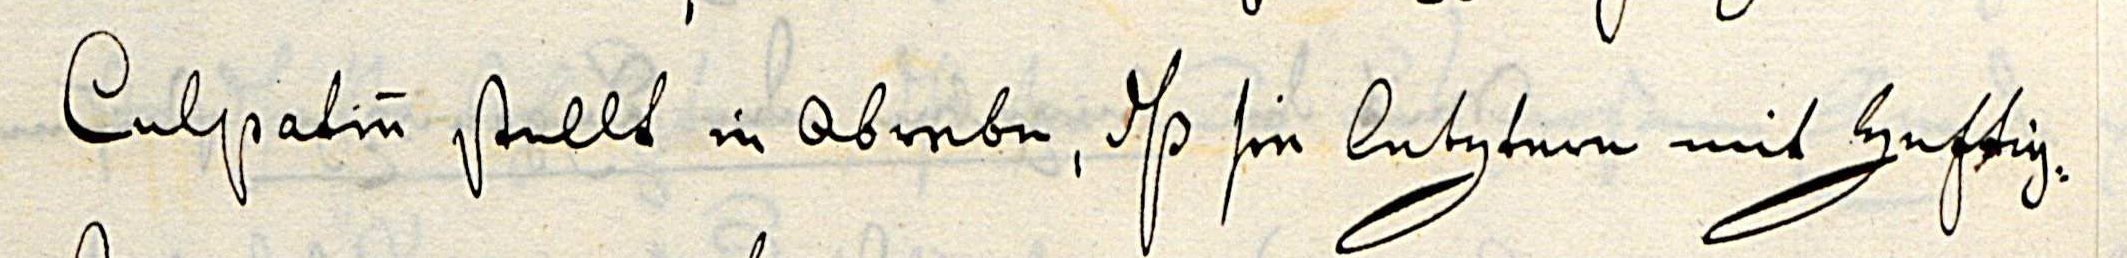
Culpatiu stellt in Abrede, daß sie letztere mit Heftig¬
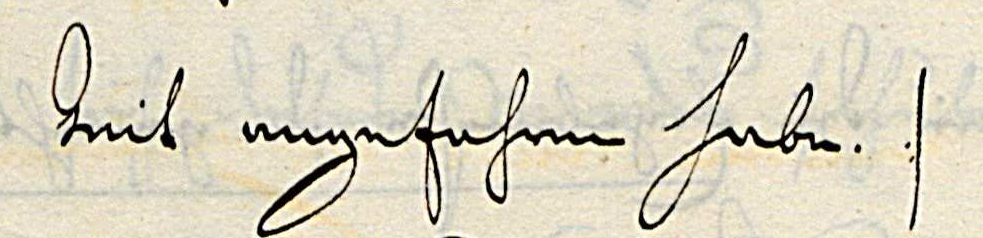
keit angefahren habe.)
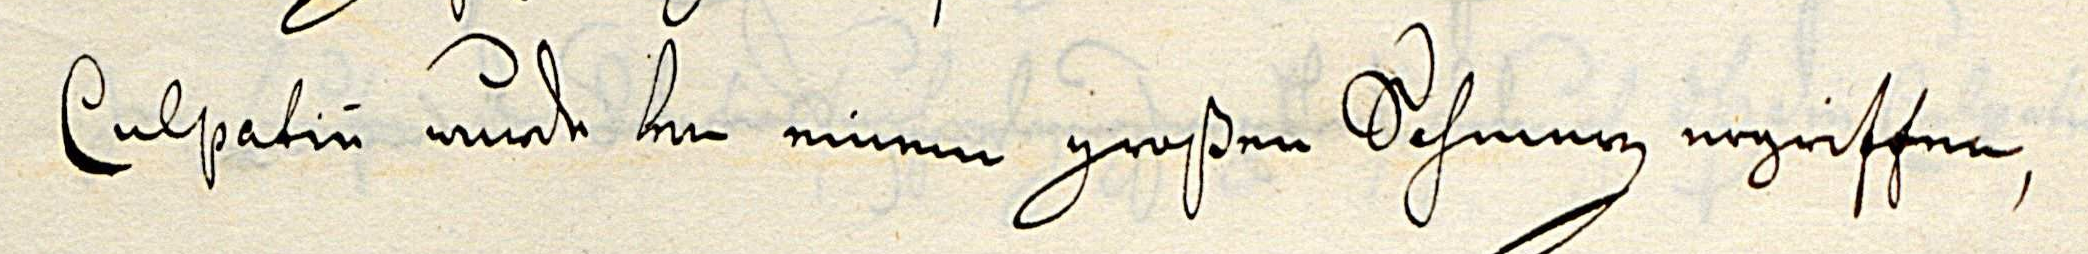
Culpatiu wurde von einem großen Schmerz ergriffen,
